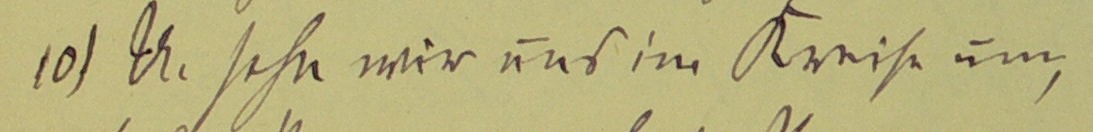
10) Und sehen wir uns im Kreise um,
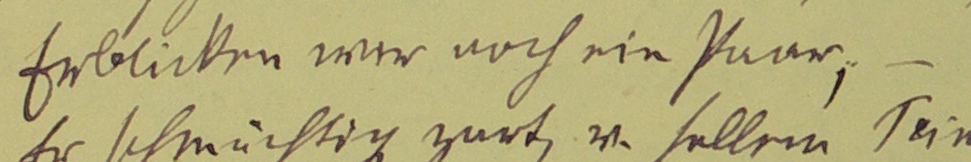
Erblicken wir noch ein Paar, -
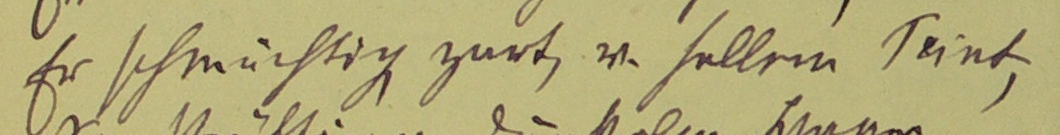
Er schmächtig zart, von hellem Teint
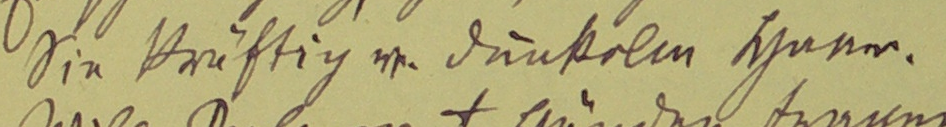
Sie kräftig v. dunklem Haar
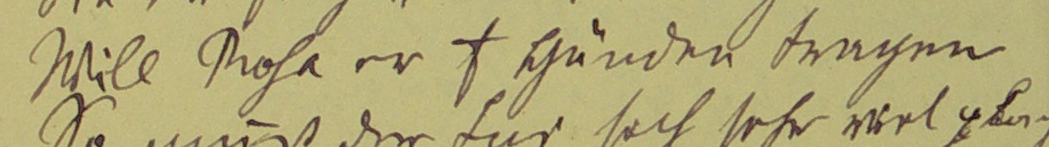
Will Proha er ??? Händen tragen
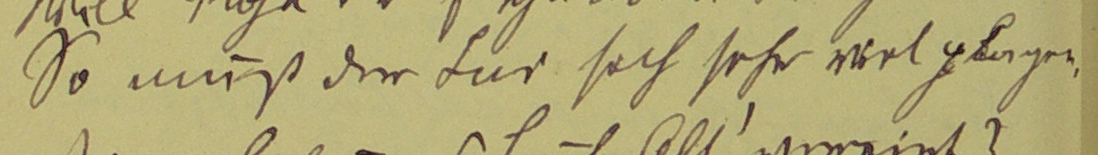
So muß der Lui sich sehr viel plagen
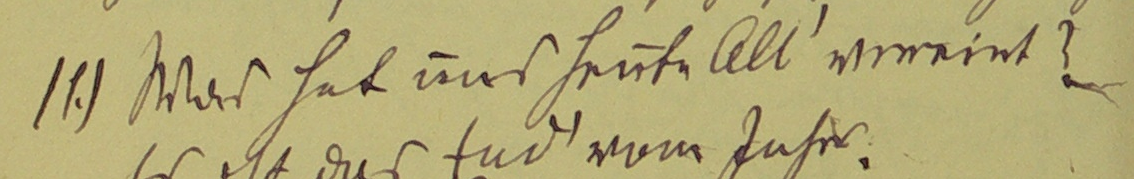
11) Was hat uns heute All vereint ?
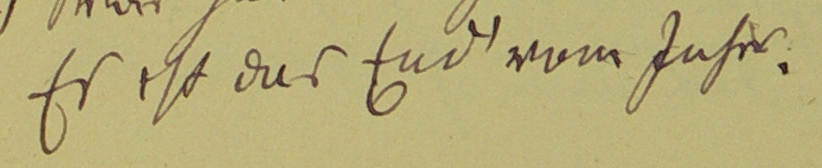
Es ist das End‘ vom Jahr------
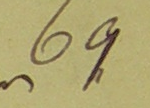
69
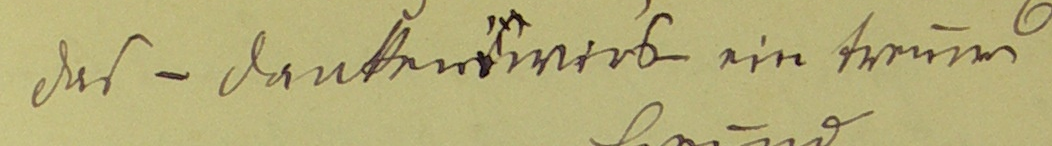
Das - dankenswert ein treuer
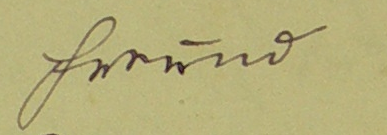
Freund
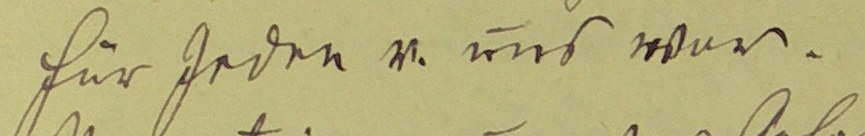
Für jeden von uns war.
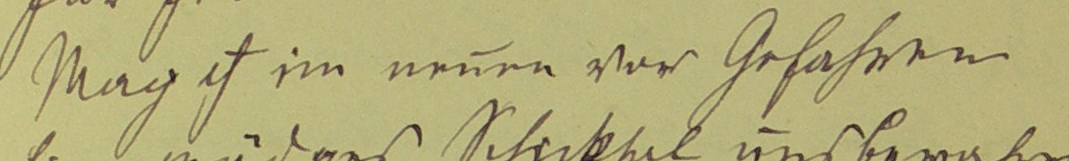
Mag auch im neuen vor Gefahren
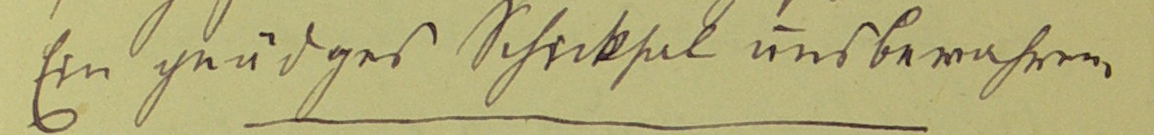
Ein gnädges Schicksal uns bewahren
